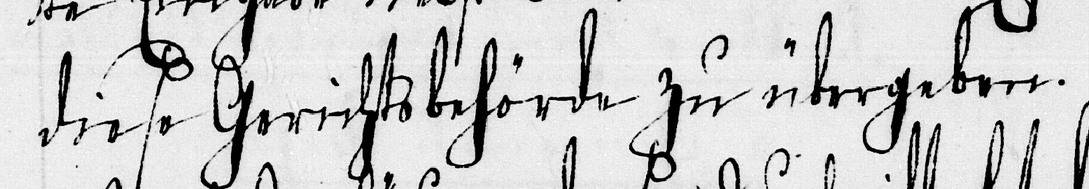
diese Gerichtsbehörde zu übergeben.
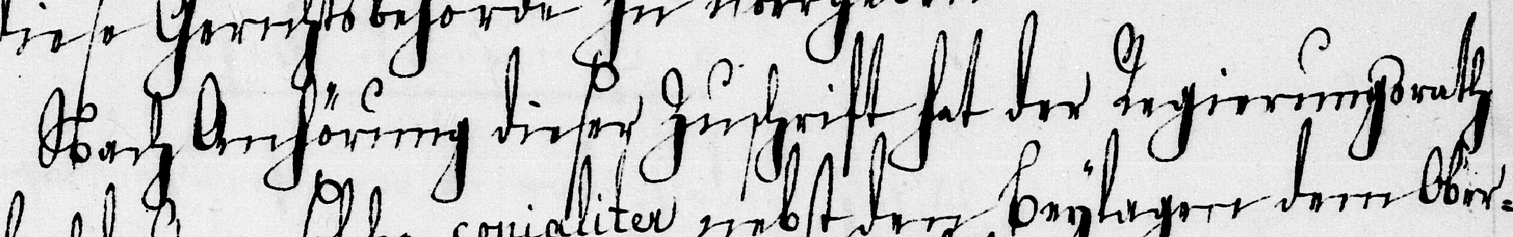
Nach Anhörung dieser Zuschrift hat der Regierungsrath
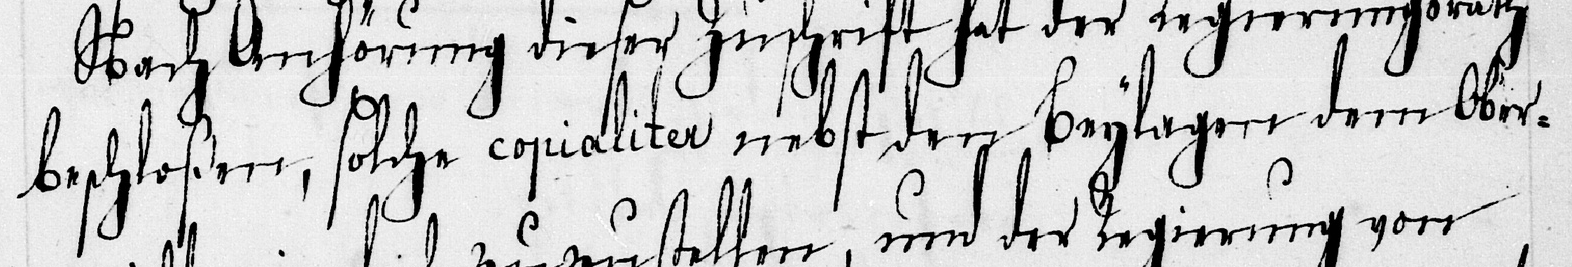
beschloßen, solche copialiter nebst den Beylagen dem Ober¬
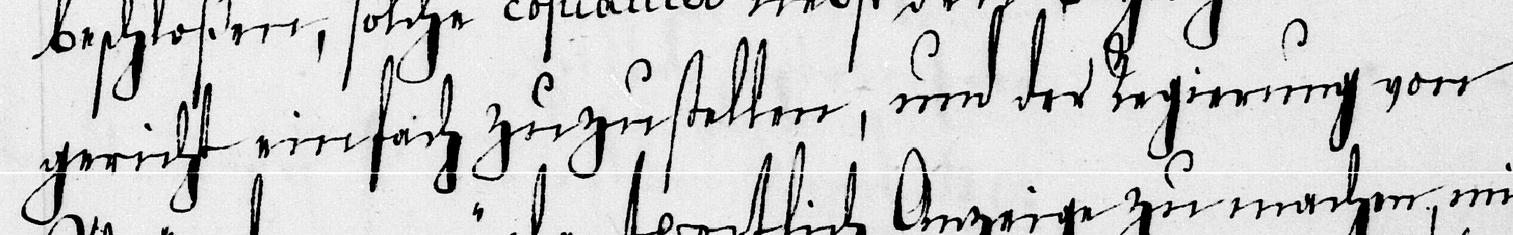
gericht einfach zuzustellen, und der Regierung von
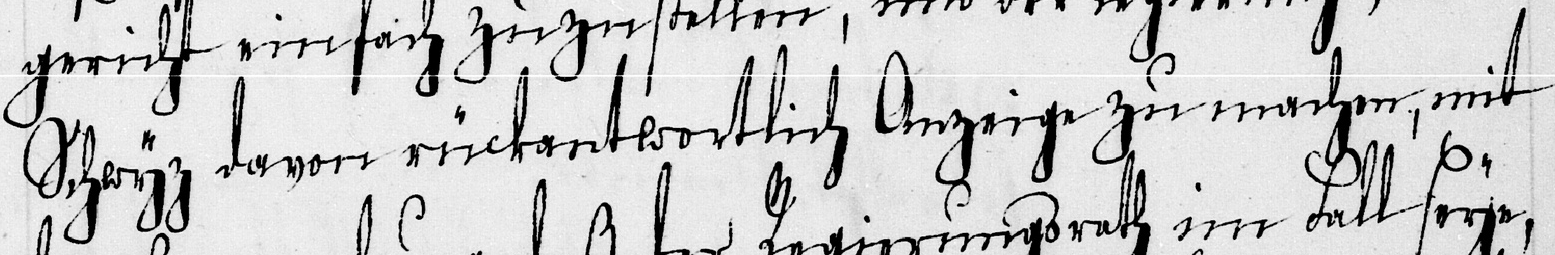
Schwyz davon rückantwortlich Anzeige zu machen, mit
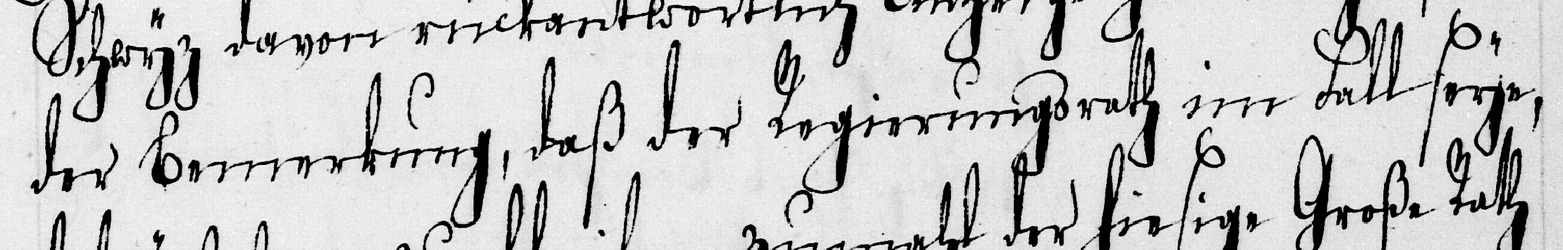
der Bemerkung, daß der Regierungsrath im Fall seye,
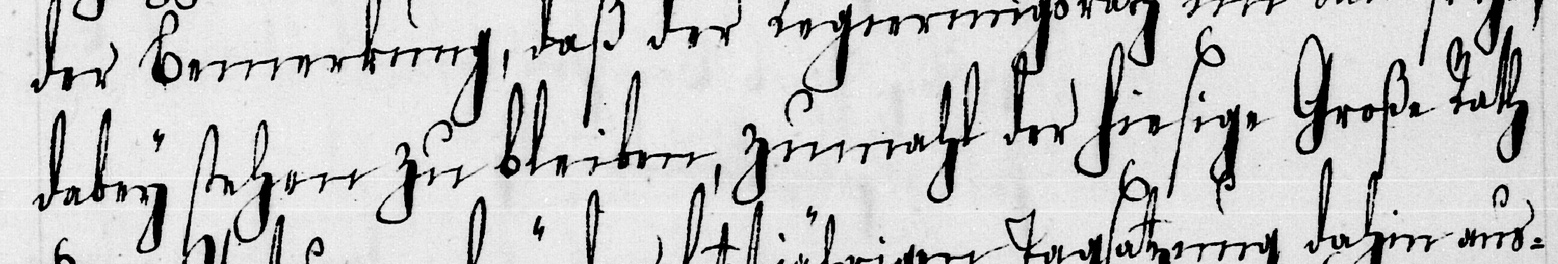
dabey stehen zu bleiben, zumahl der hiesige Große Rath
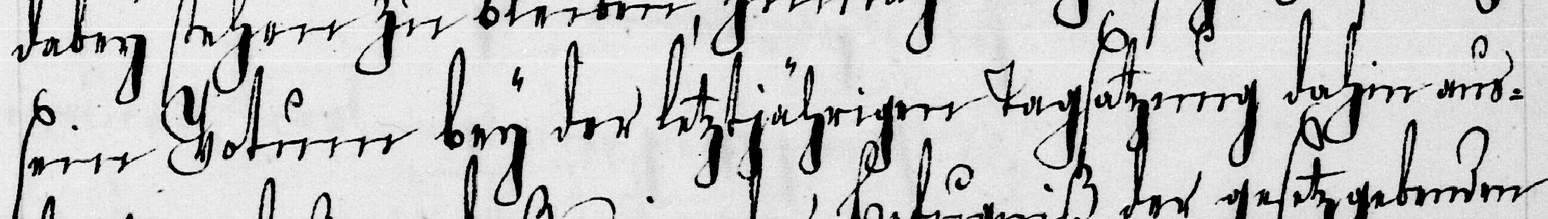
sein Votum bey der letztjährigen Tagsatzung dahin aus¬
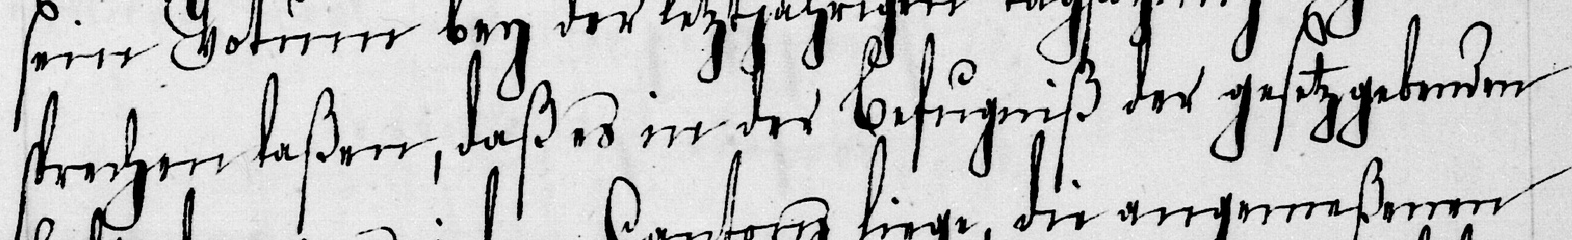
sprechen laßen, daß es in der Befugniß der gesetzgebenden
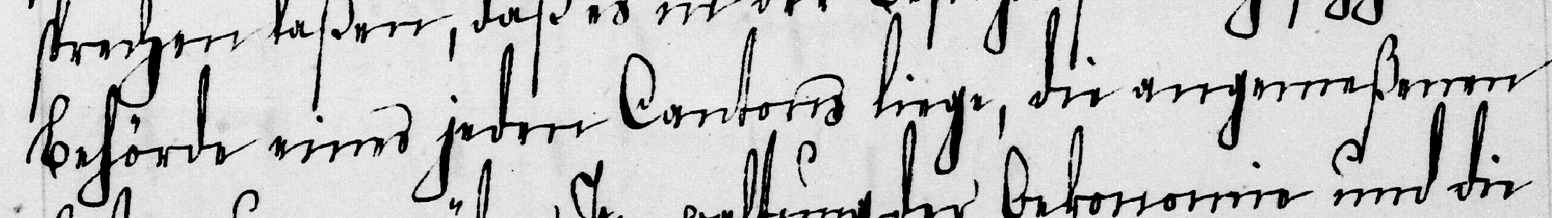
Behörde eines jeden Cantons liege, die angemeßenen
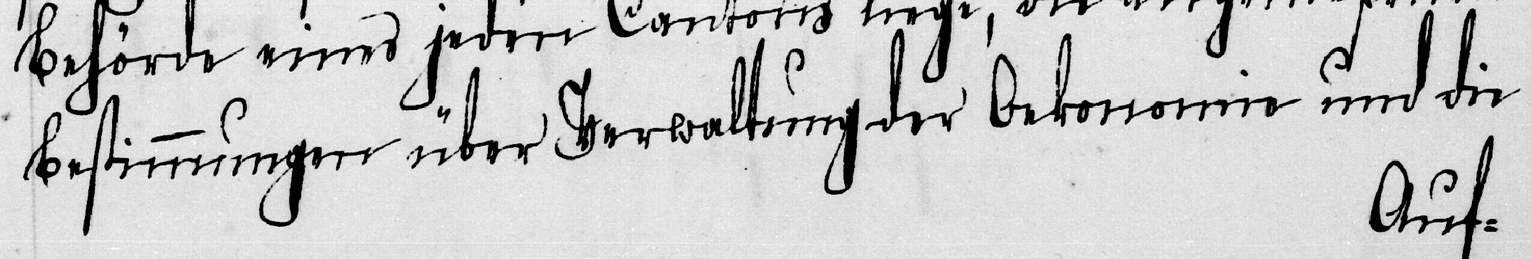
Bestimmungen über Verwaltung der Oekonomie und die
